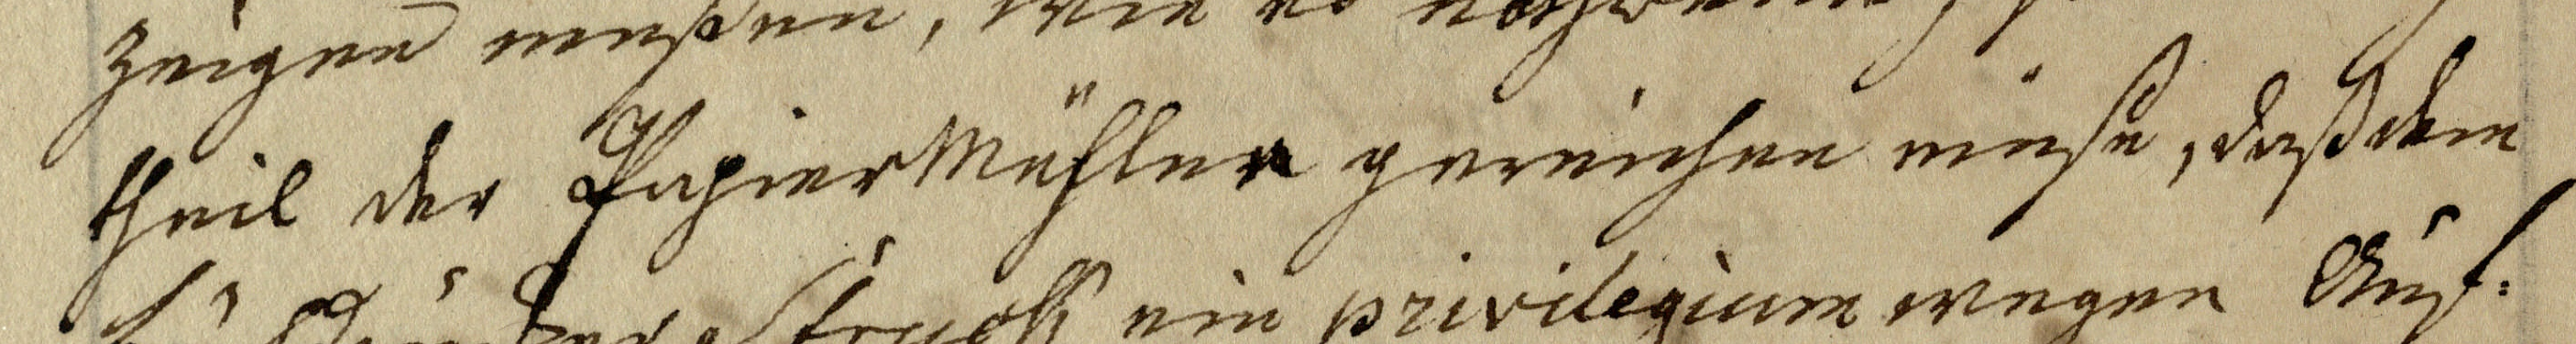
theil der PapierMühlen gereichen müße, daß dem
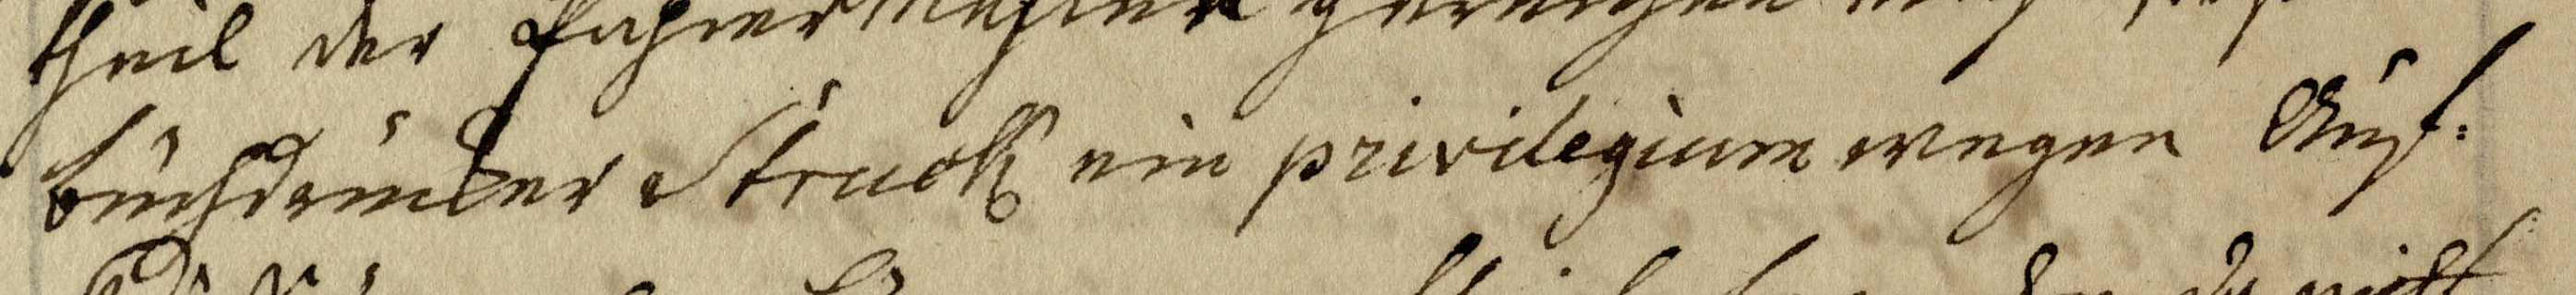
Buchdrucker Struck ein privilegium wegen Auf¬
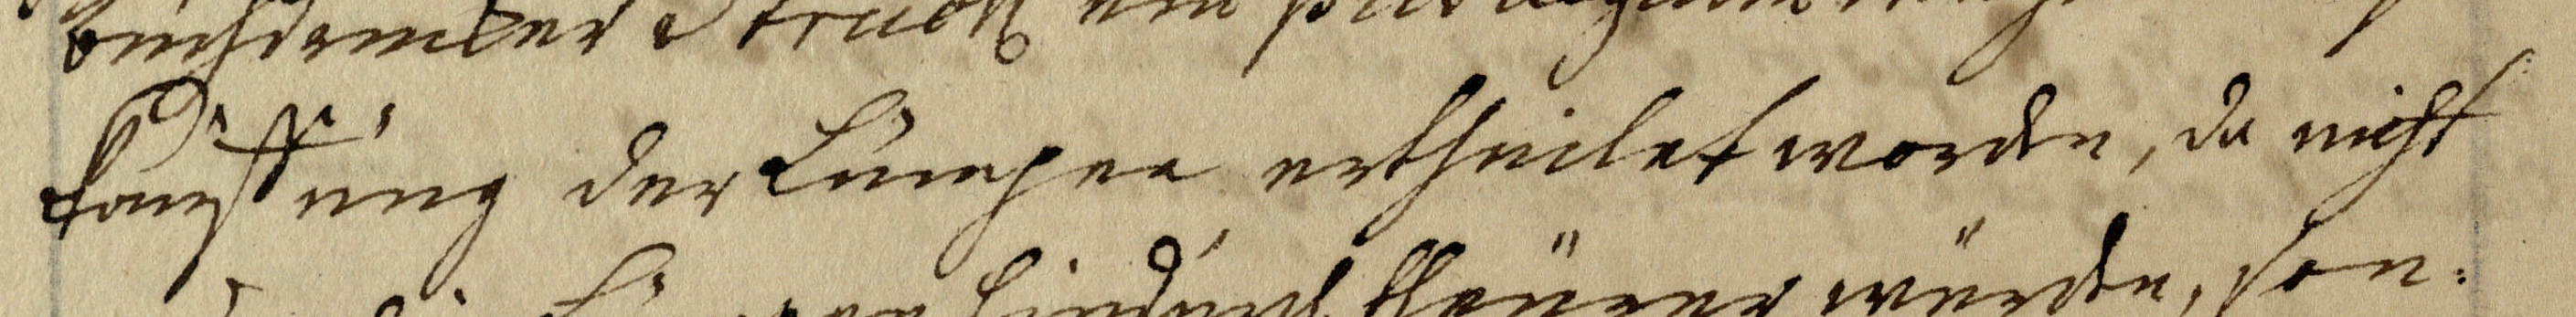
kauffung der Lumpen ertheilet worden, da nicht
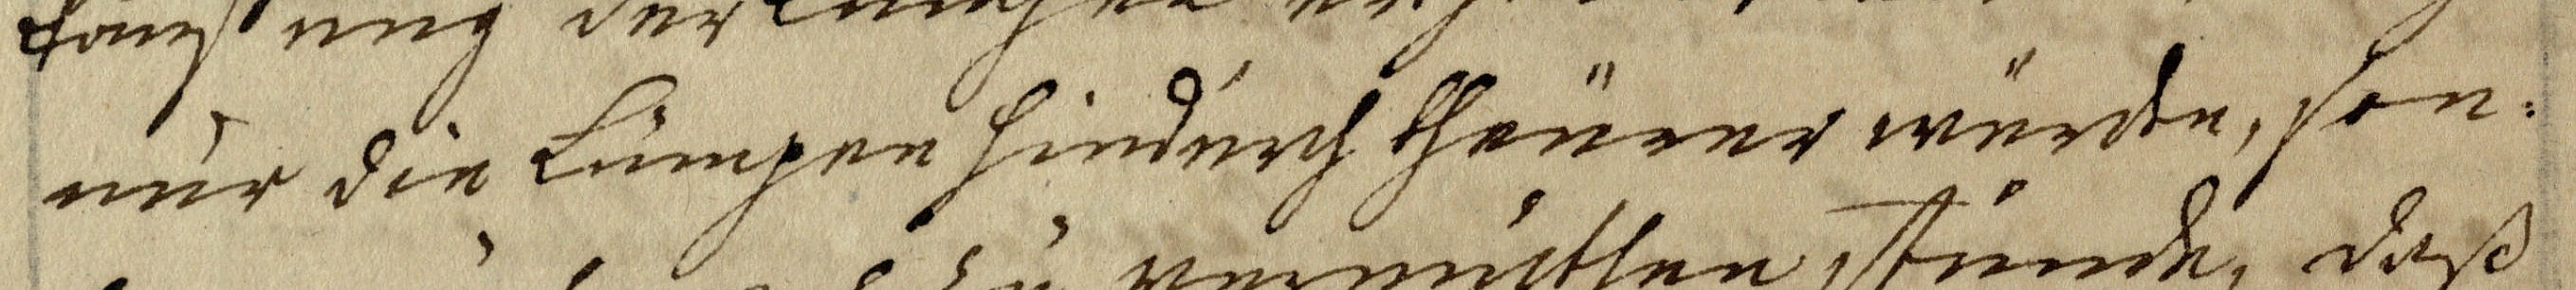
nur die Lumpen hiedurch theurer würden, son¬
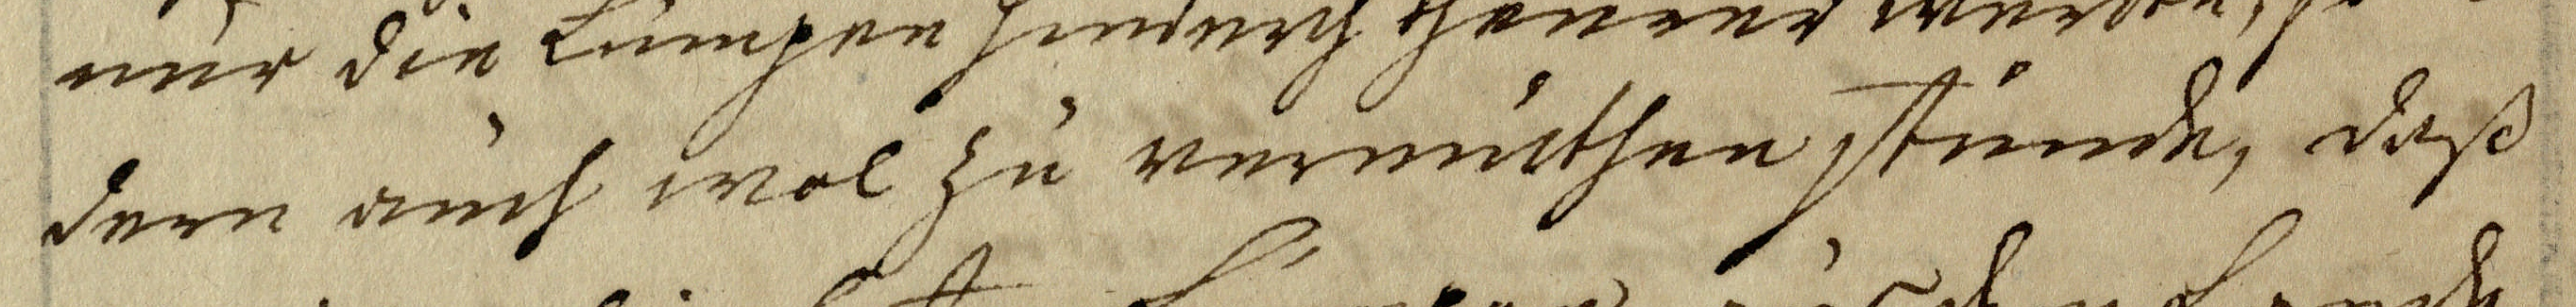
dern auch wohl zu vermuthen stünde, daß
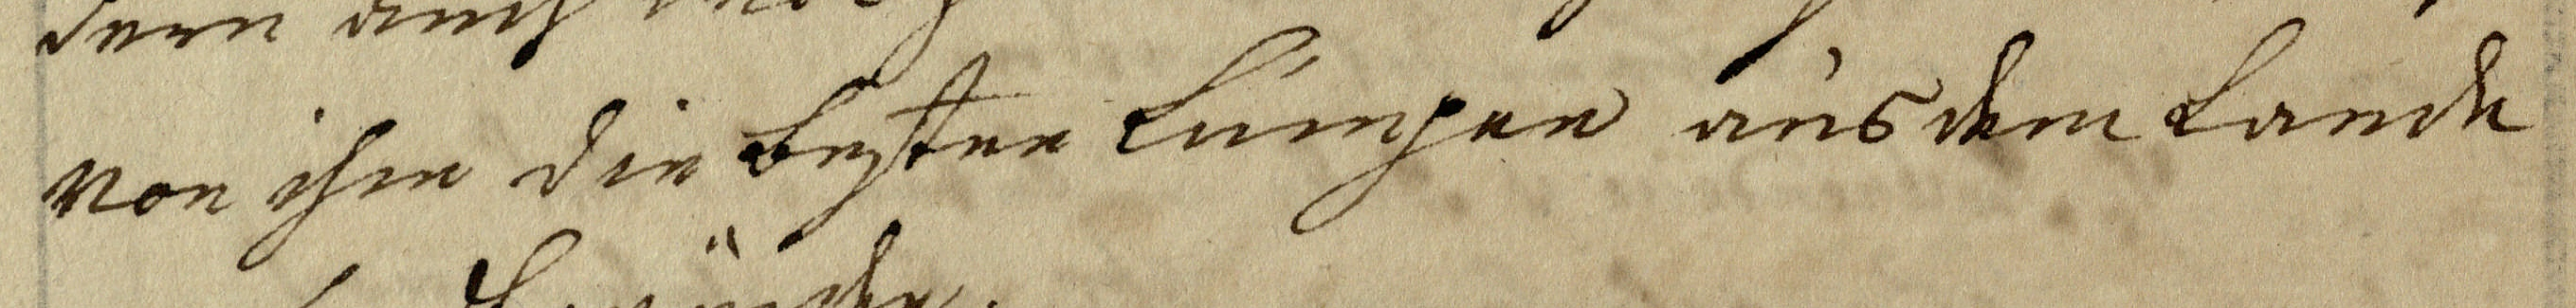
von ihm die Besten Lumpen ausd em Lande
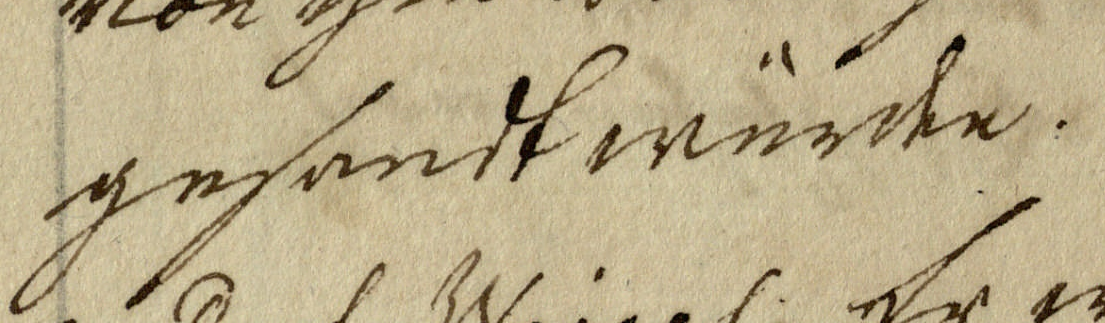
gesandt würden.
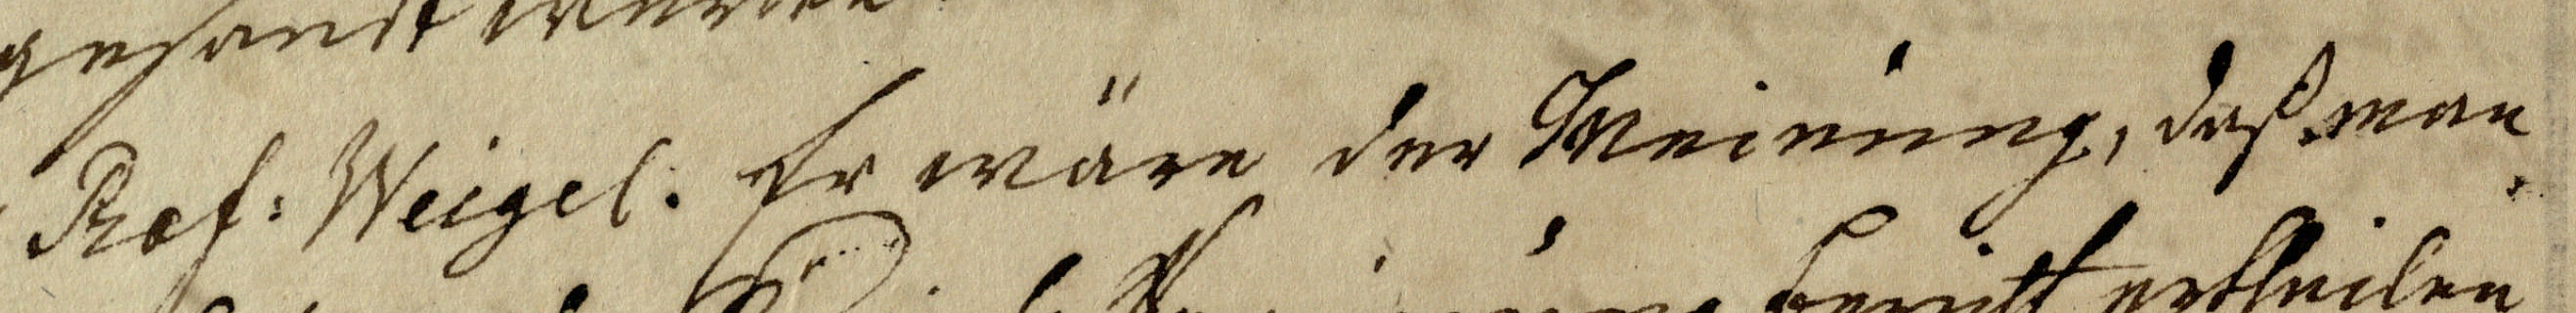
dh Prof. Weigel. Er wäre der Meinung, daß man
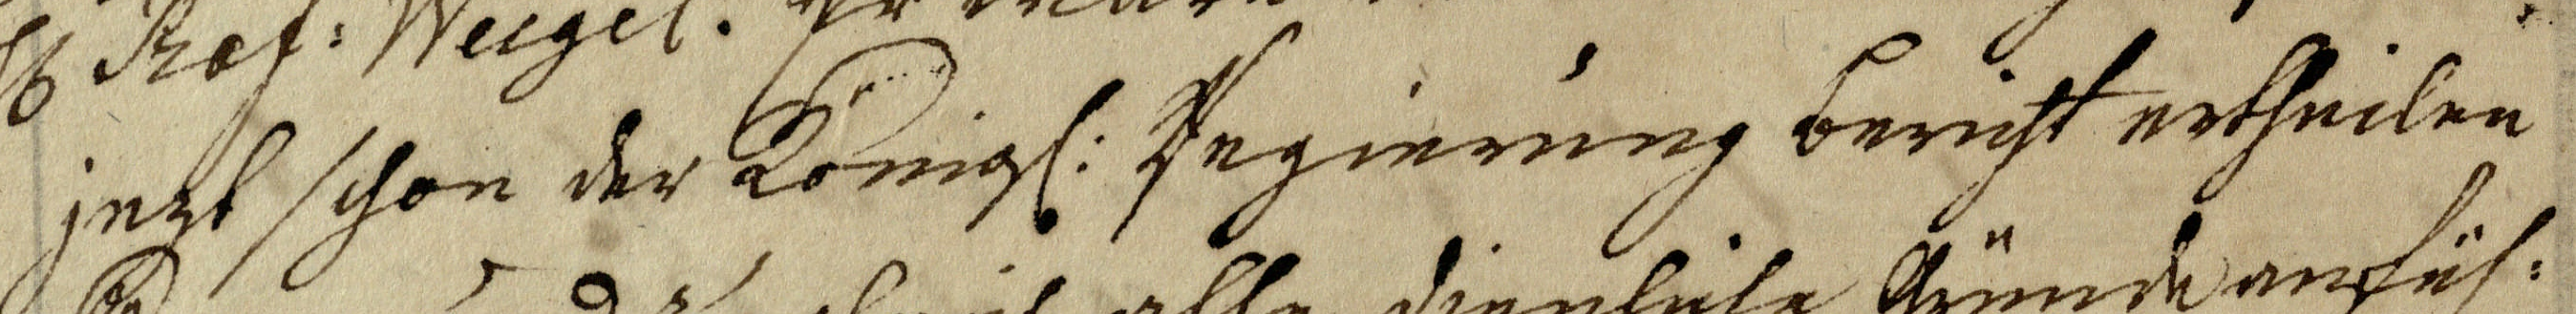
jezt schon der Königl. Regierung Bericht ertheilen
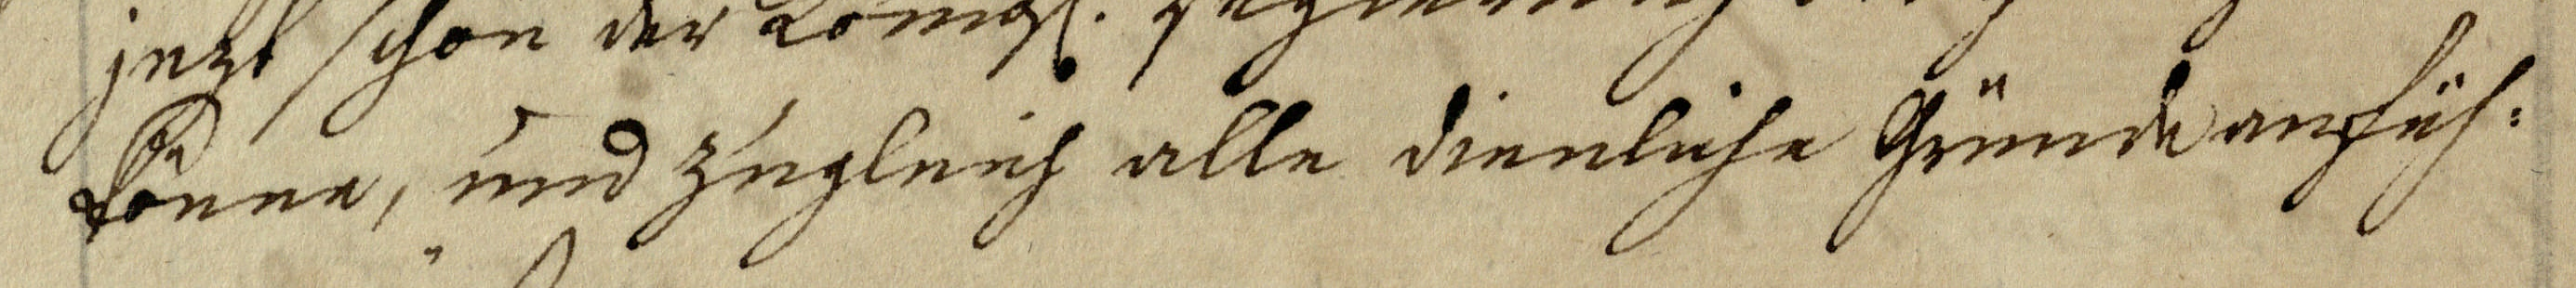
könne, und zugleich alle dienliche Gründe anfüh¬
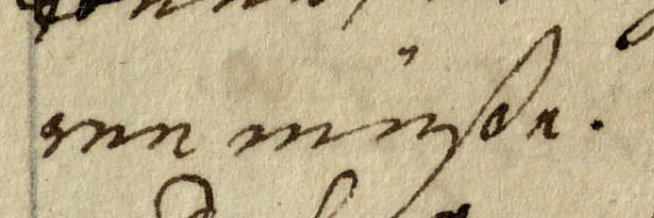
ren müße.
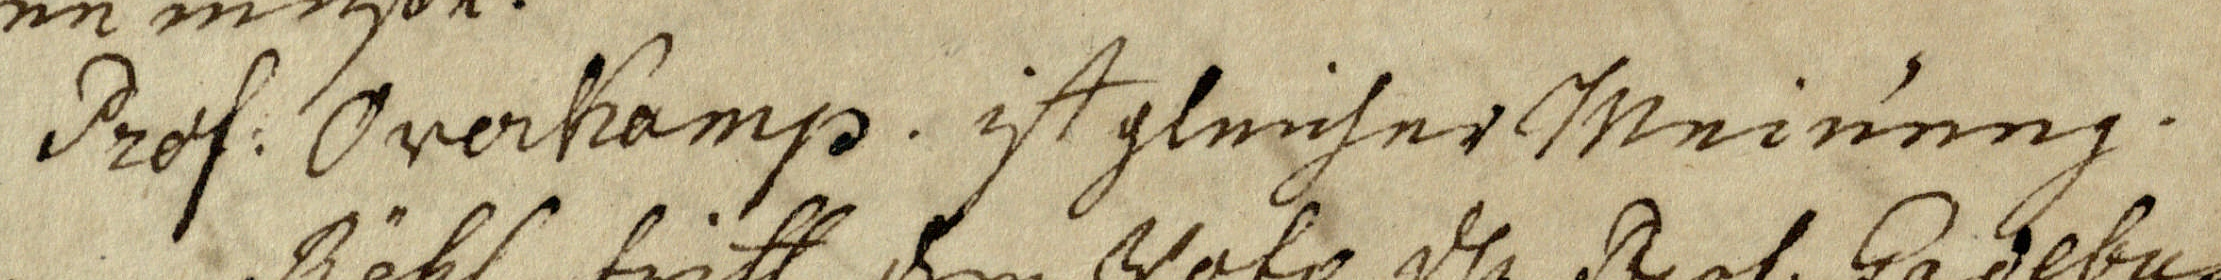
dh Prof. Overkamp. ist gleicher Meinung.
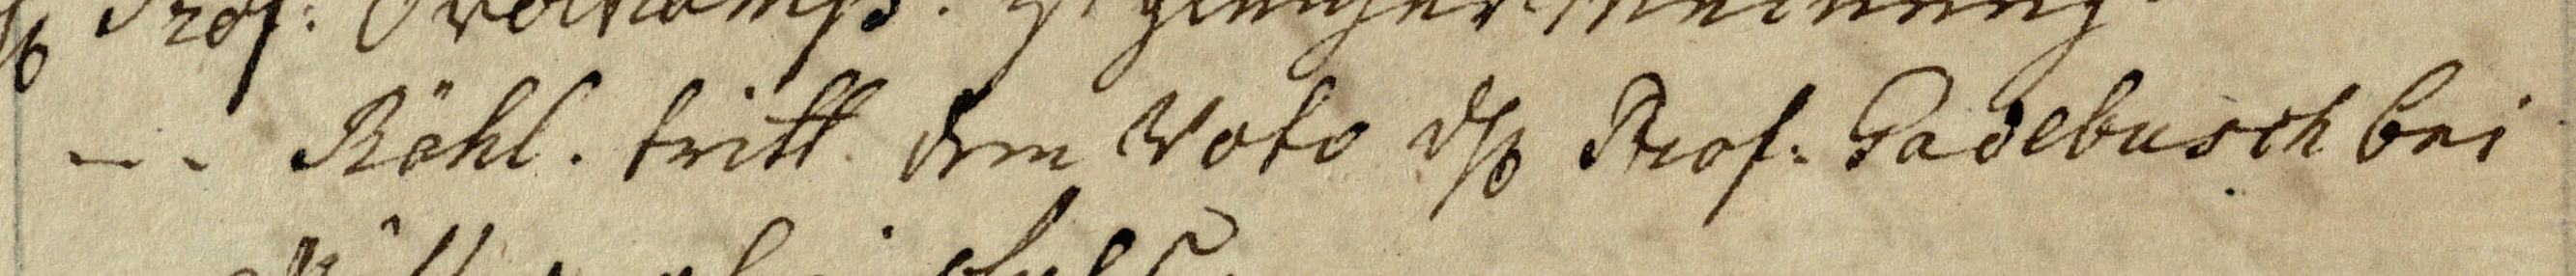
REöhl. tritt dem Voto dh Prof. Gadebusch bei
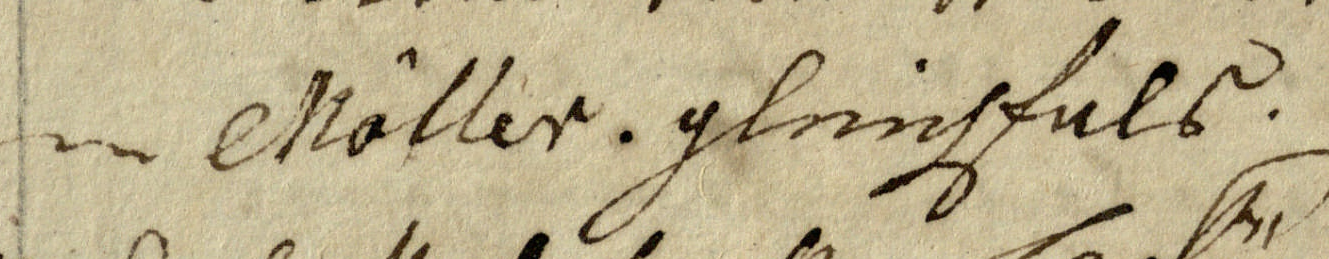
Möller. gleichfals.
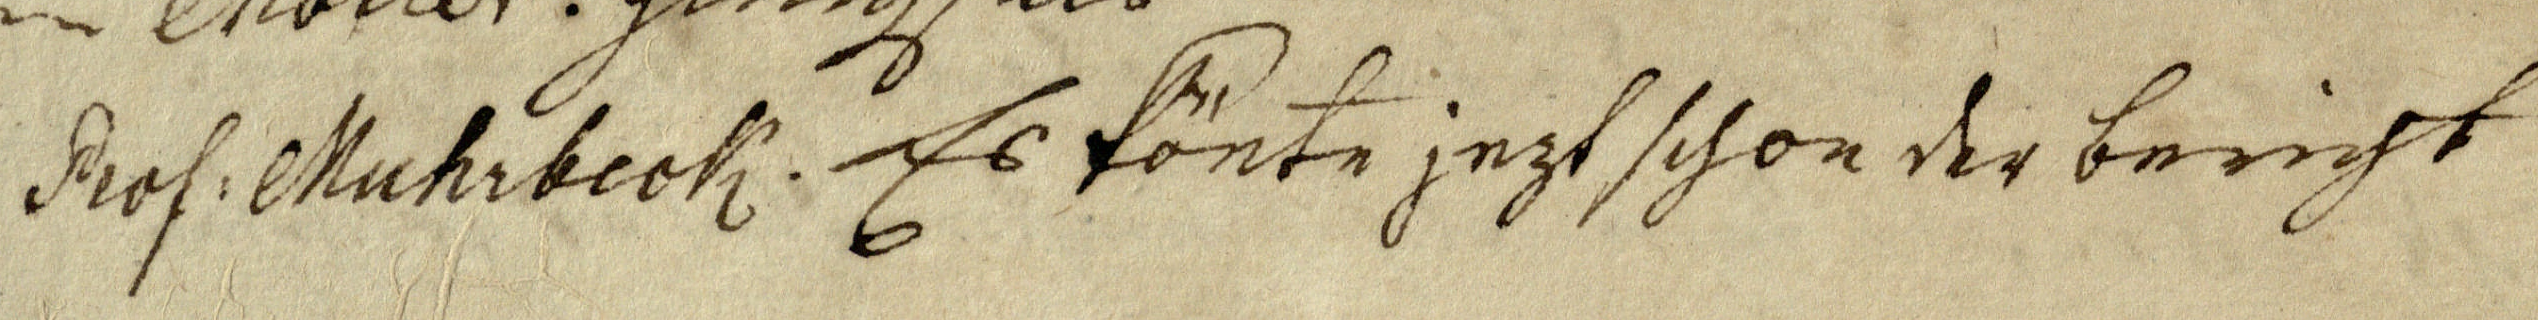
dh Prof. Muhrbeck. Es könte jezt schon der Bericht
